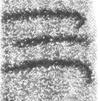三
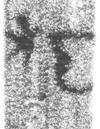柧（虡）
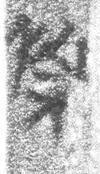○（簨）
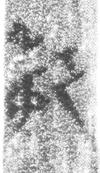厀（漆）
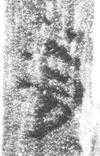○（畫）
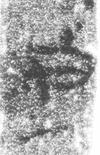金
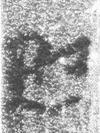○（珥）
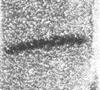一
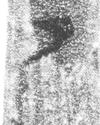坐
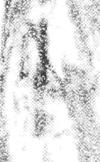少（小）
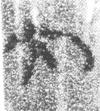大
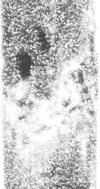十
